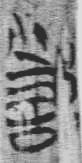○（察）
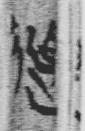道
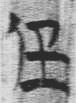坐
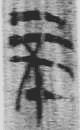不
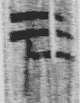下
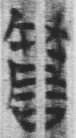○（席）
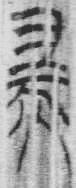耑
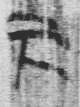下
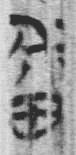番
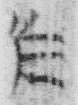於
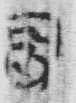囦（淵）
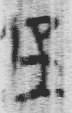坐
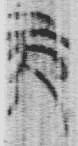而
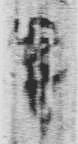思
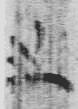之
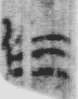於
